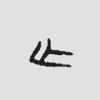亡
